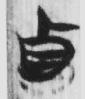貞
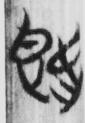既
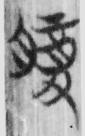腹
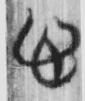心
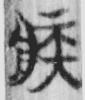疾
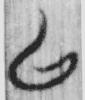㠯（以）
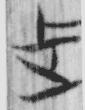上B
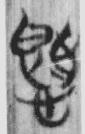○（氣）
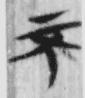不
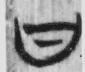甘
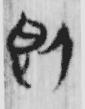○（食）
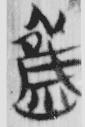舊（久）
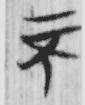不
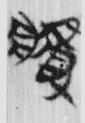○（瘥）
